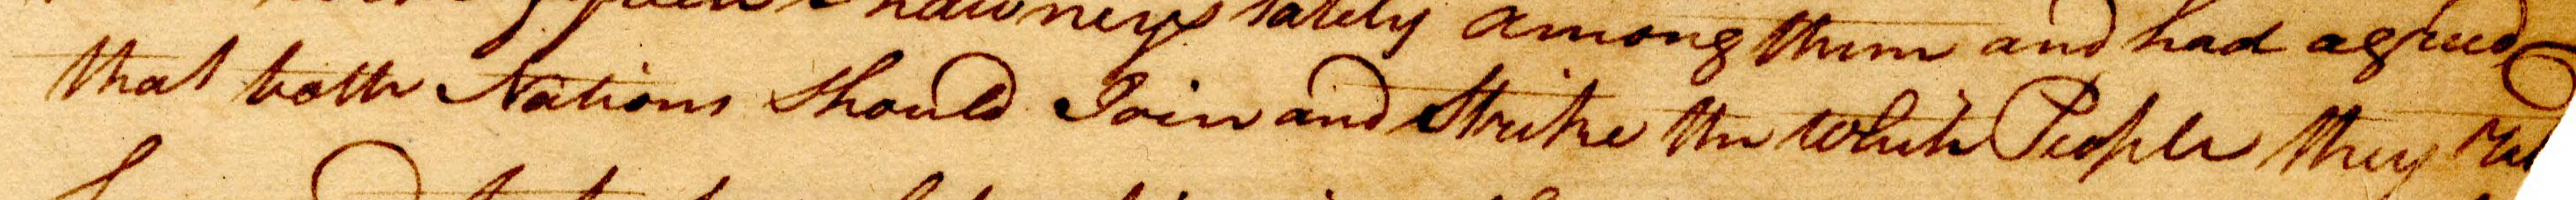that both Nations should Join and Strike the white People they re
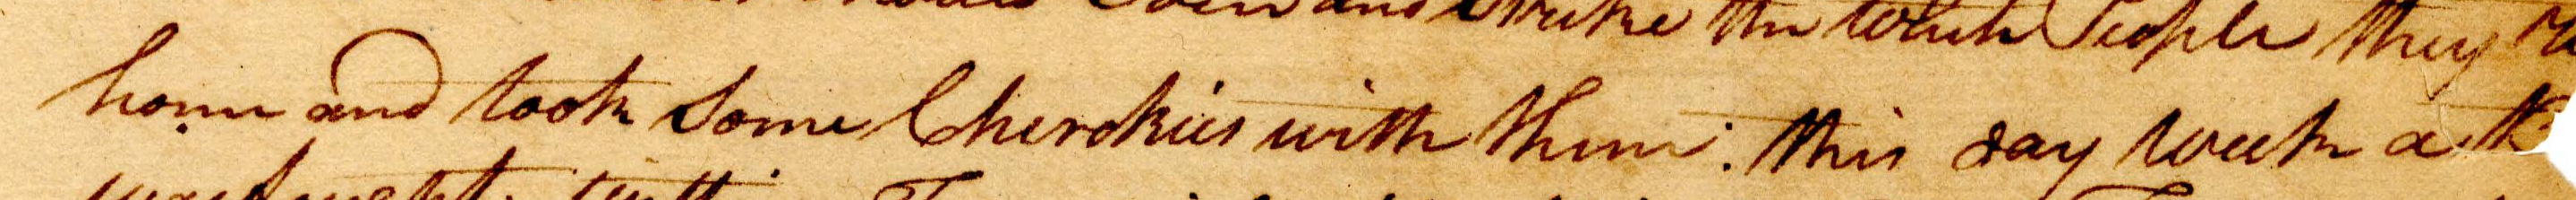home and took Some Cherokies with them: this day weeks at the
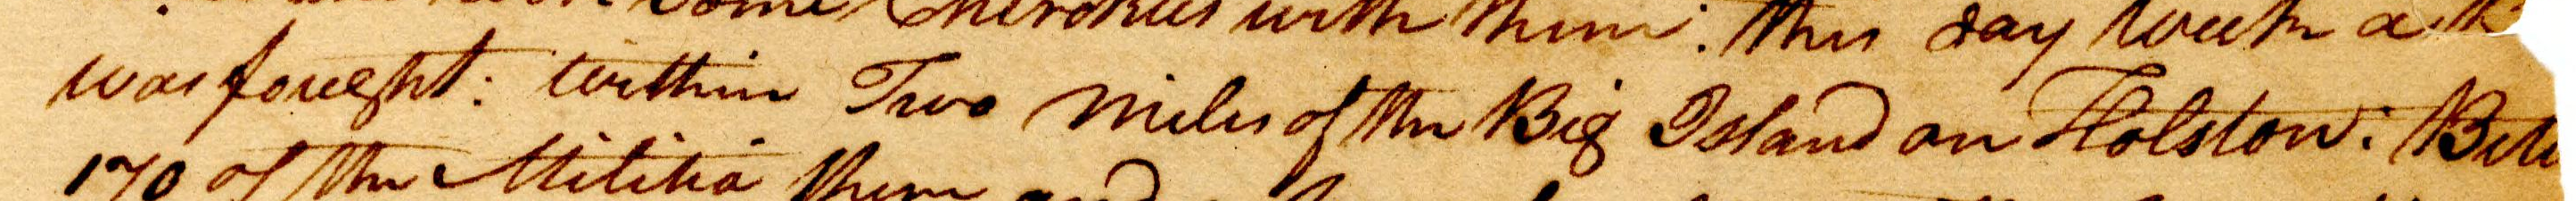was fought: within Two miles of the Big Island on Holston: Batt
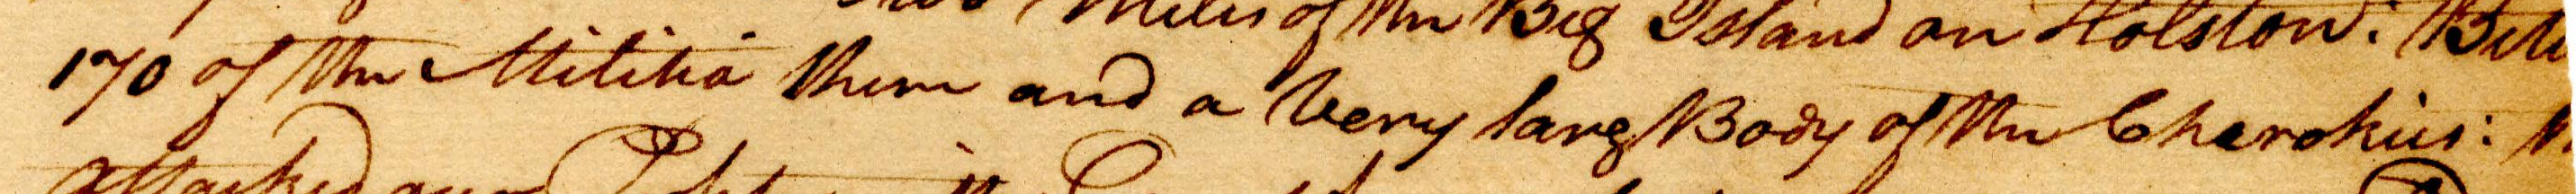170 of the Militia there and a very larg Body of the Cherokies:
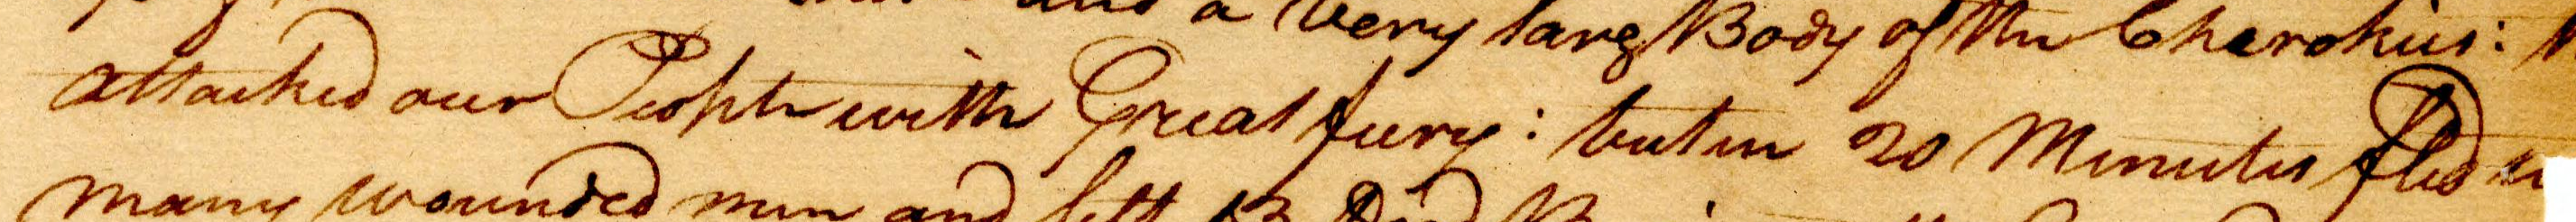attacked our People with Great fury: but in 20 Minutes fled
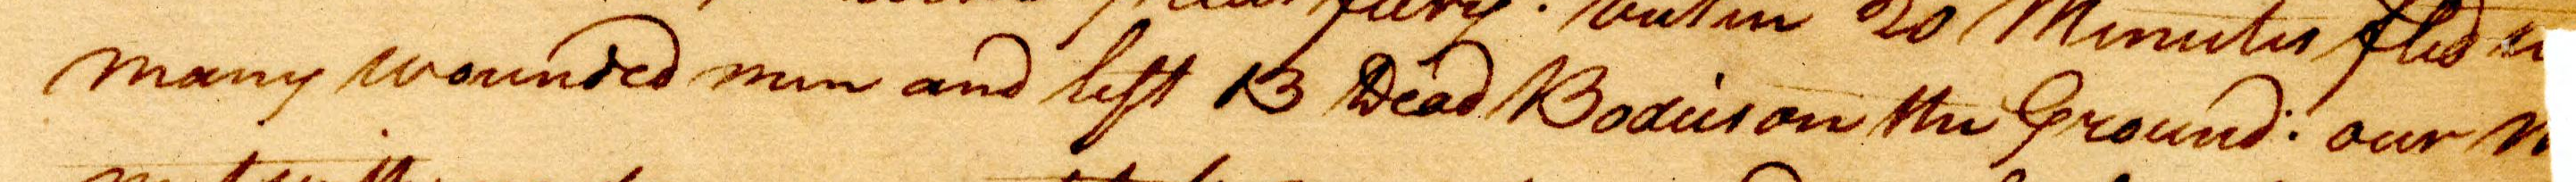many wounded men and left 13 Dead Bodies on the Ground: our n
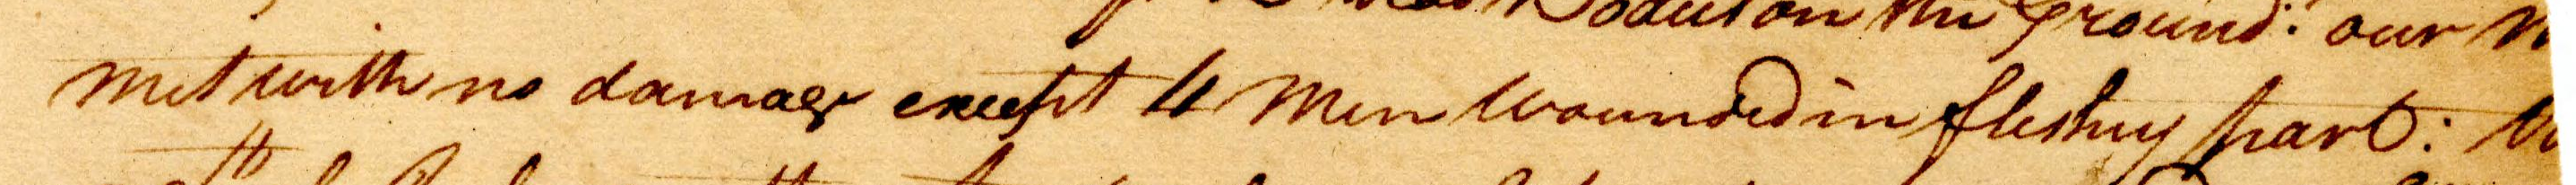met with no damage except 4 Men wounded in fleshey part:
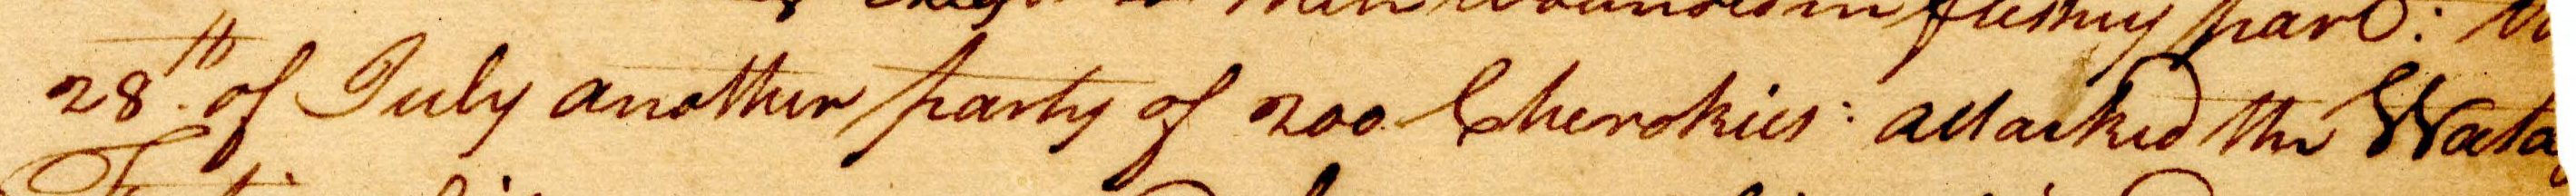28^th. of July another party of 200 Cherokies: attacked the Wala
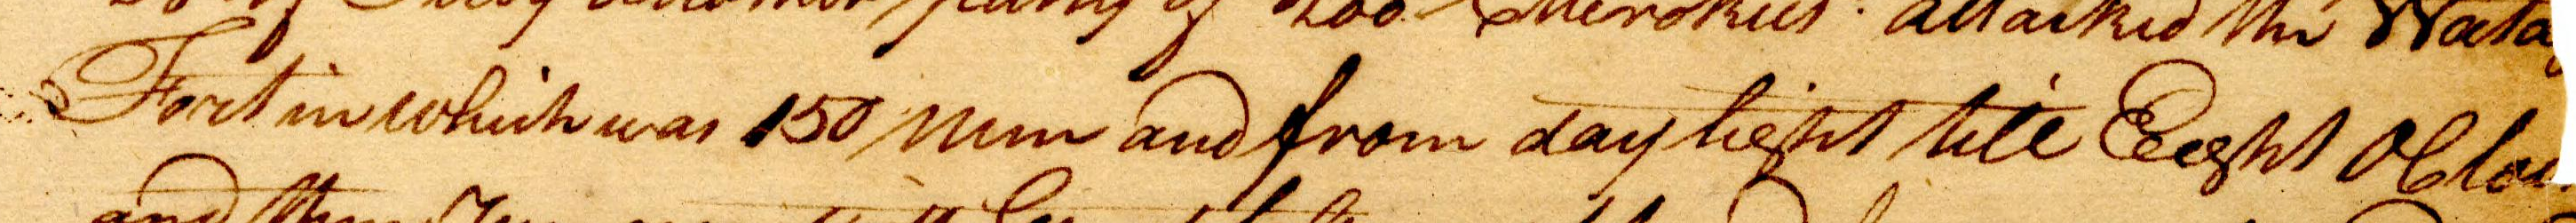Fort in which was 150 men and from daylight till Eight OCloc
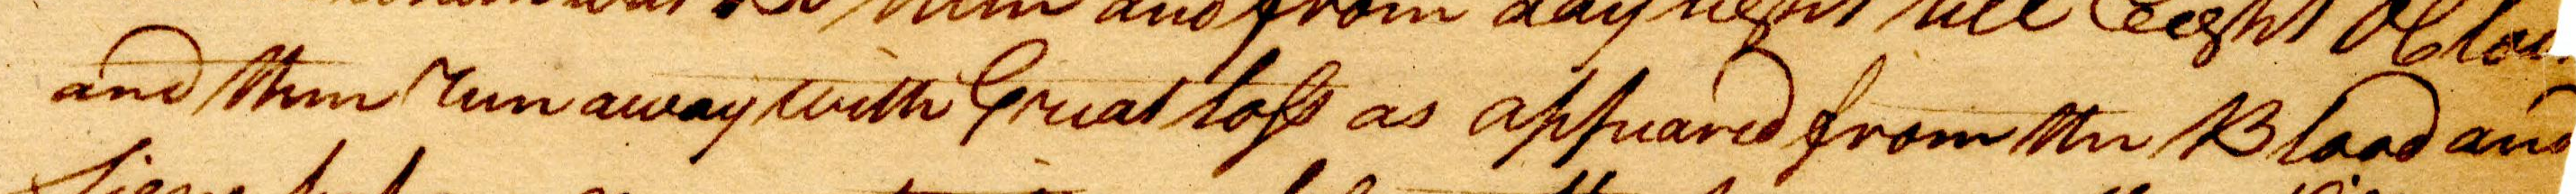and then run away with Great loss as appeared from the Blood and
